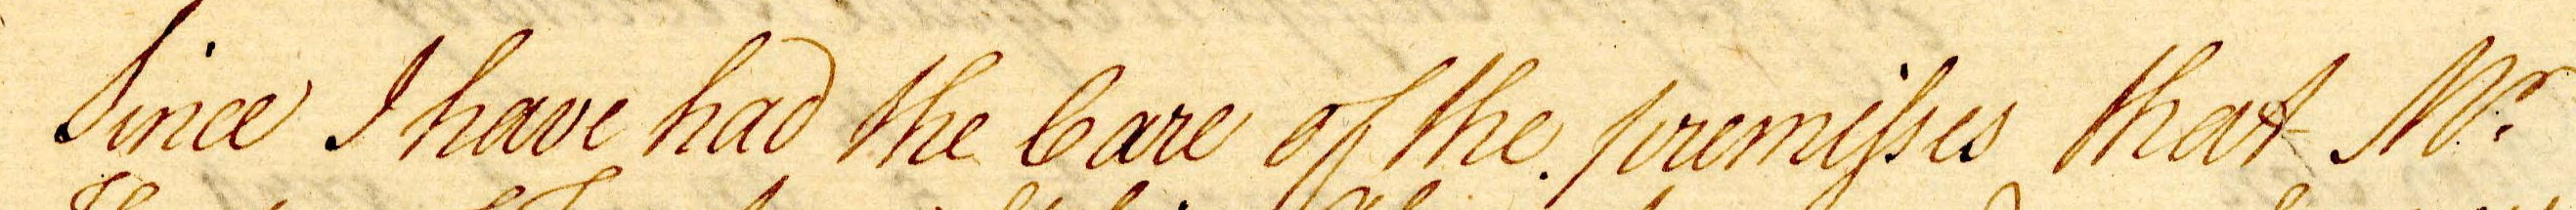Since I have had the Care of the premisses that M.^r
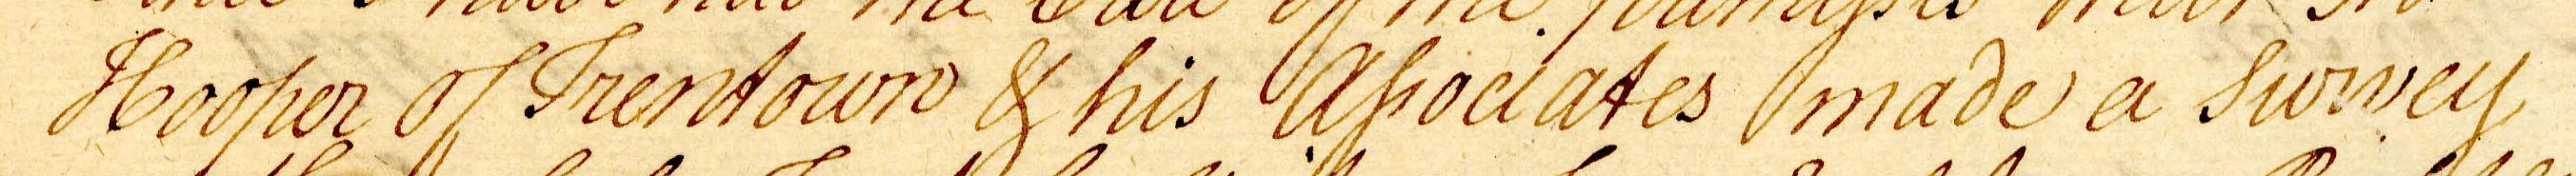Hooper of Trentown & his Associates made a Survey
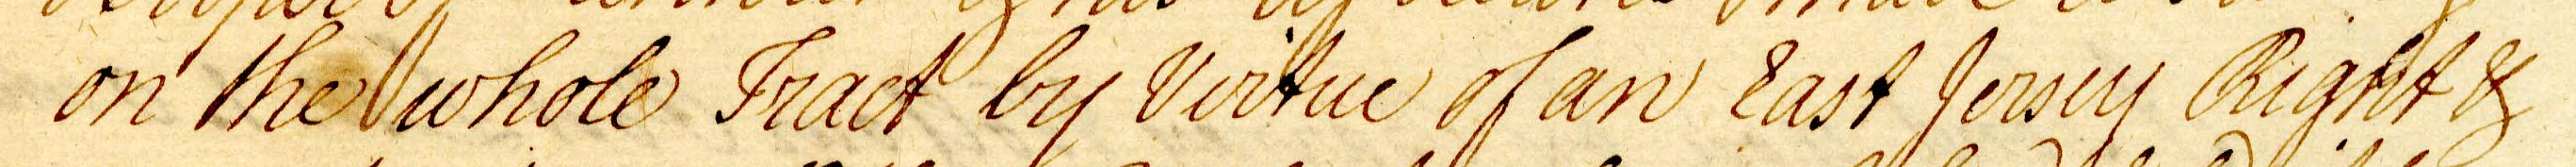on the whole Tract by Virtue of an East Jersey Right &
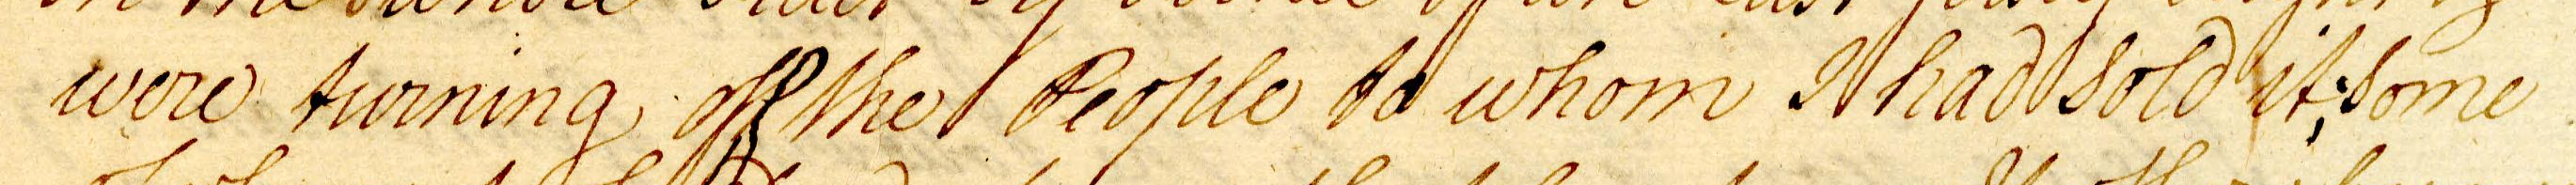were turning off the People to whom I had Sold it, Some
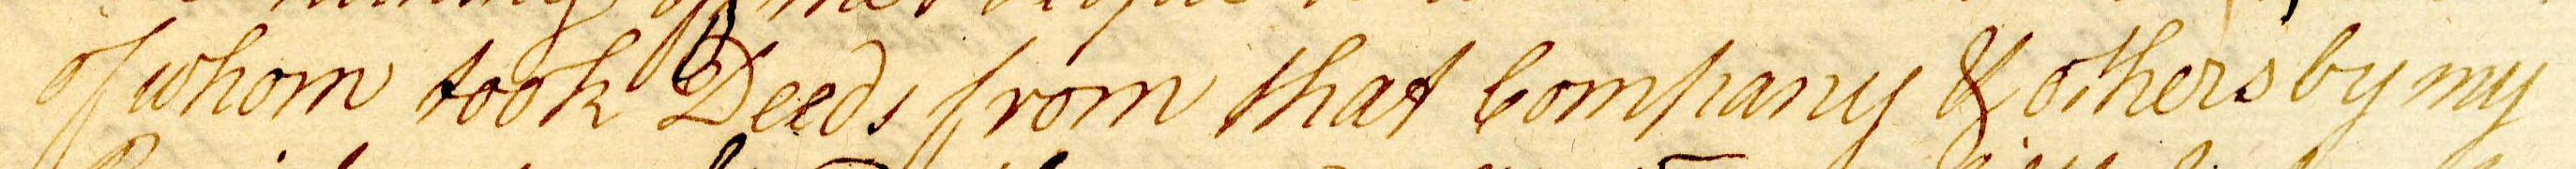of whom took Deeds from that Company & others by my
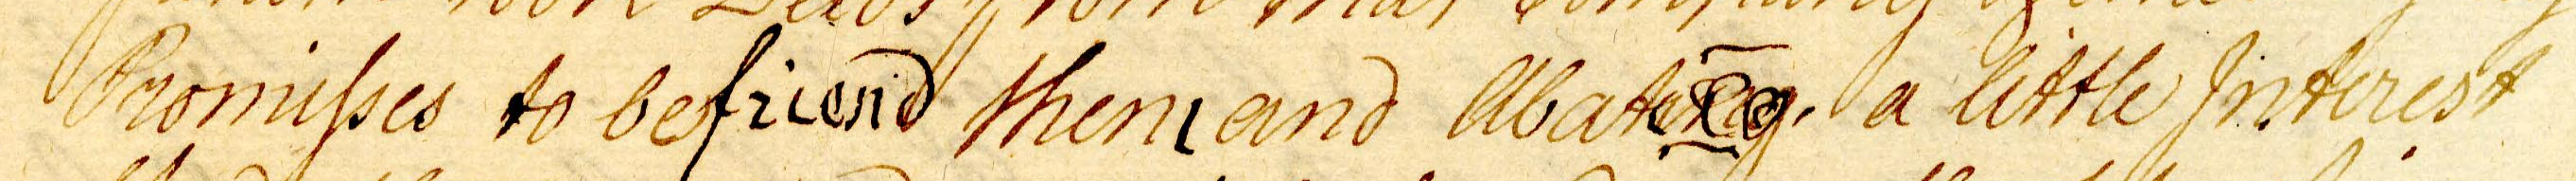Promisses to befriend them and Abating a little Interest
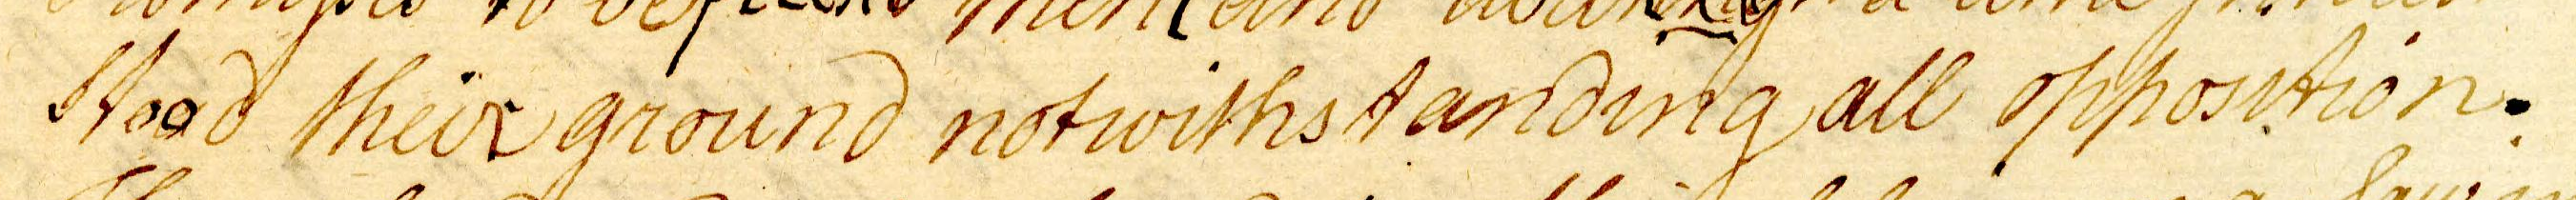Stood their ground notwithstanding all opposition.
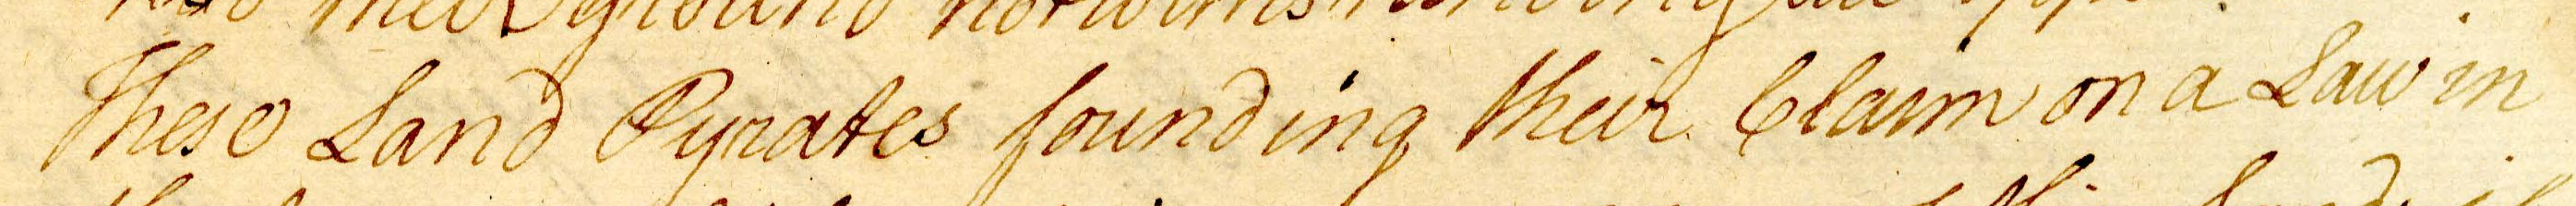These Land Pyrates founding their Claim on a Law in
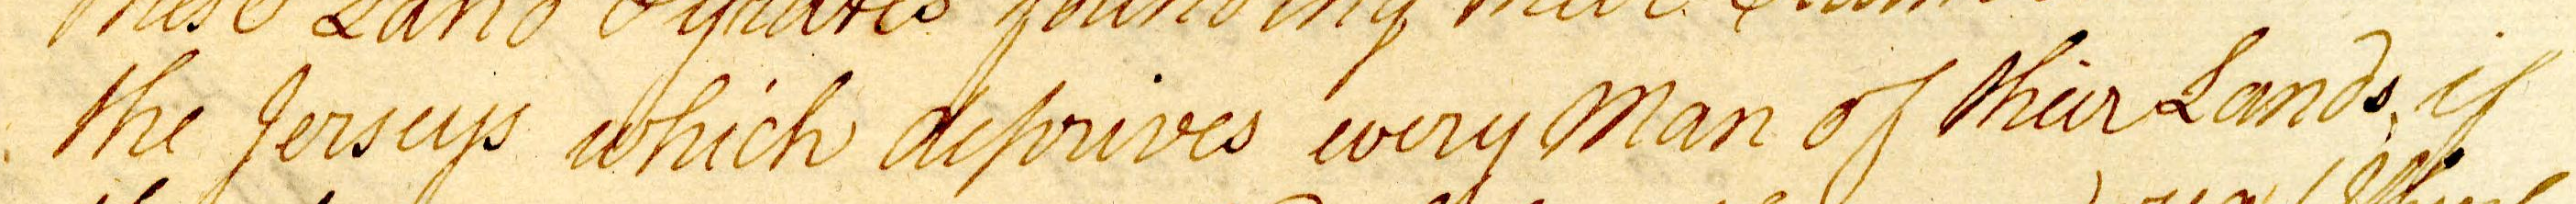the Jerseys which deprives every Man of their Lands, if
